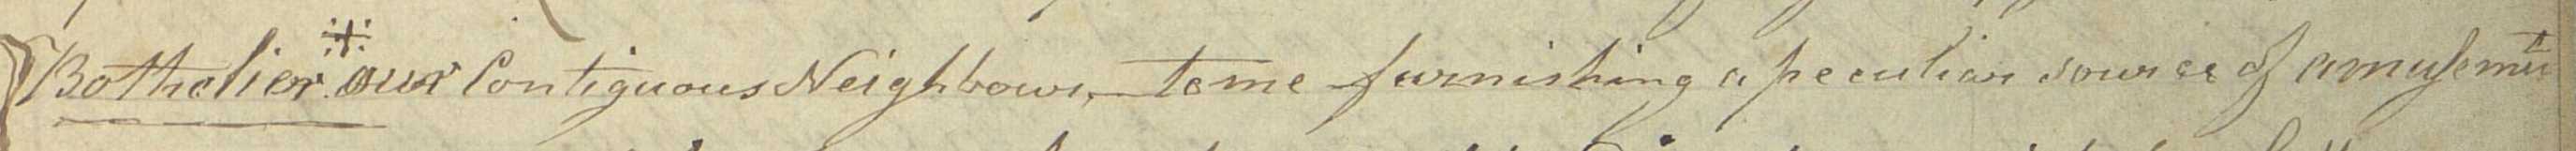Bothelier our Contiguous Neighbour, to me furnishing a peculiar source of amusement
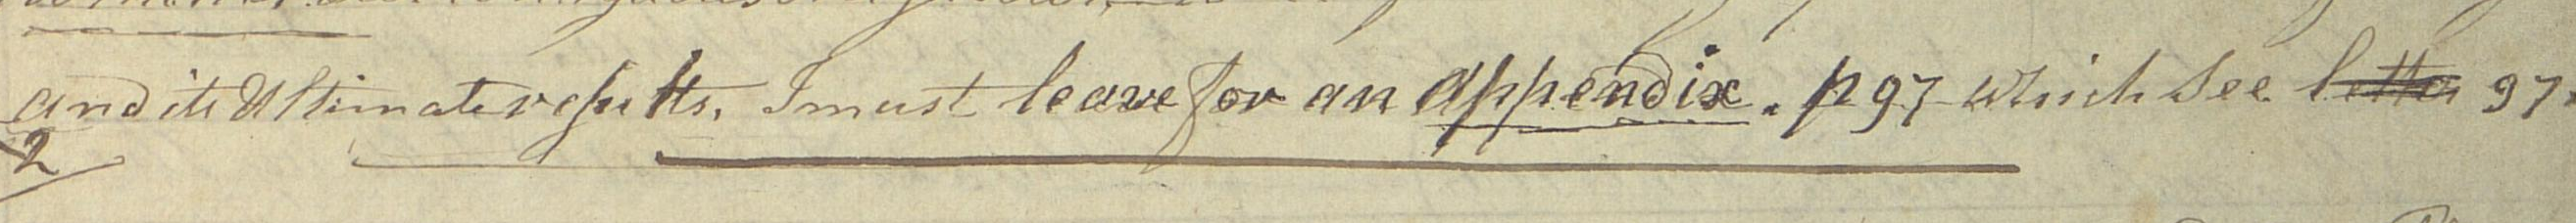and its ultimate results, I must leave for an Appendix. p 97 which see letter 97.
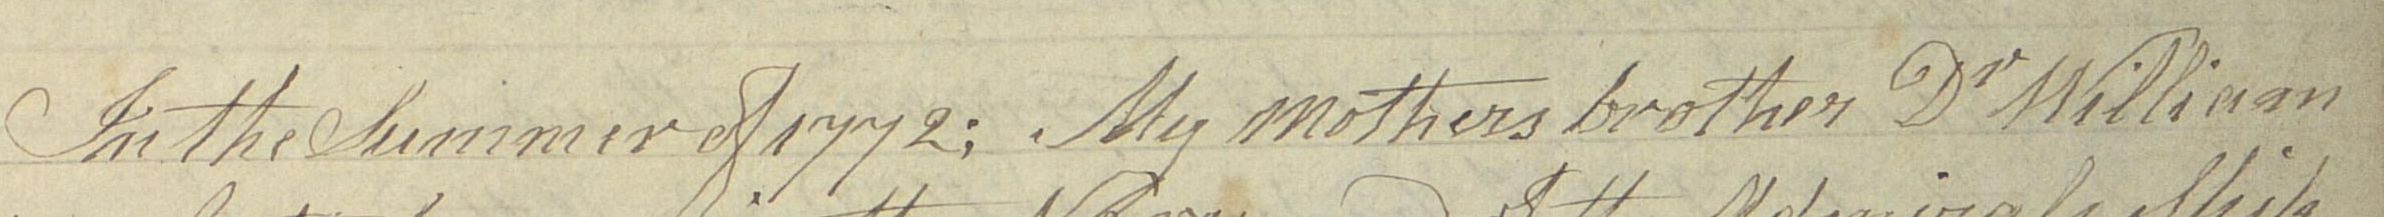In the Summer of 1772; My mothers brother D^r William
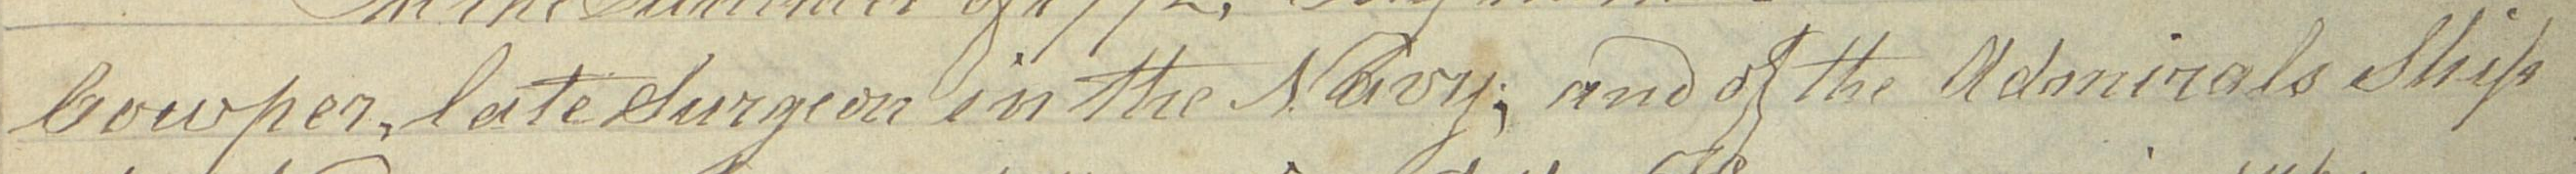Cowper, late Surgeon in the Navy; and of the Admirals Ship
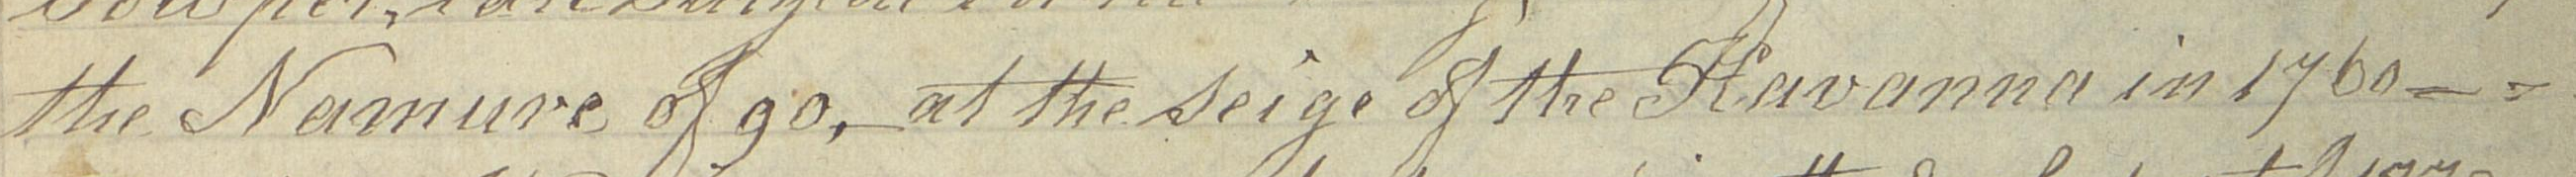the Namure of 90, at the seige of the Havanna in 1760.
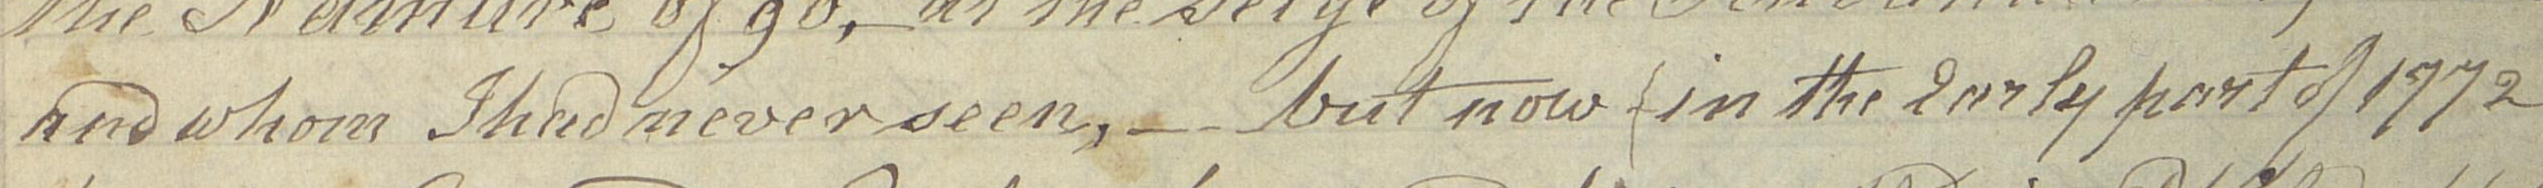and whom I had never seen, but now in the Early part of 1772
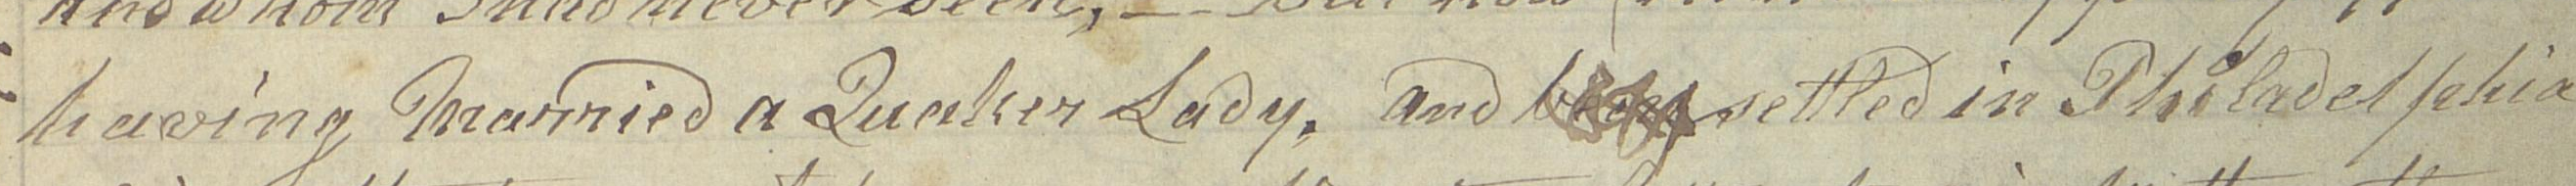having Married a Quaker Lady, and been settled in Philadelphia
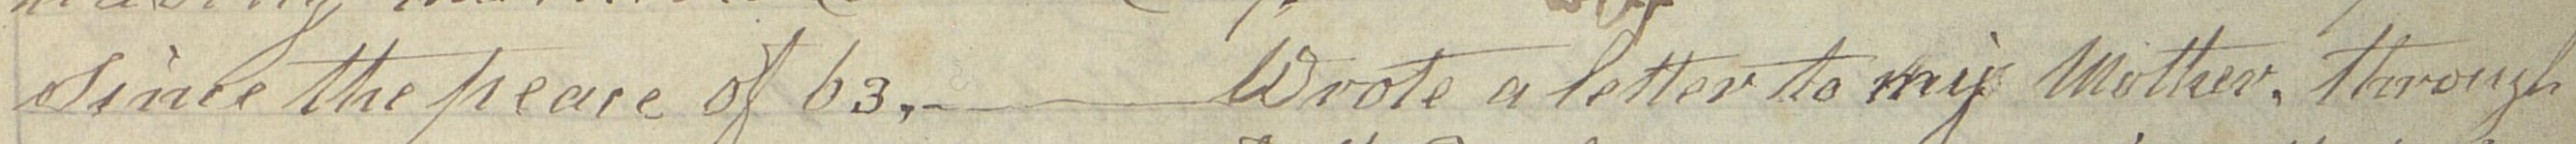Since the peace of 63. Wrote a letter to my Mother through
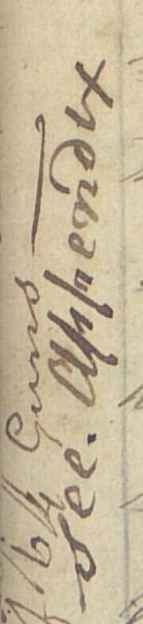See. Appendix
